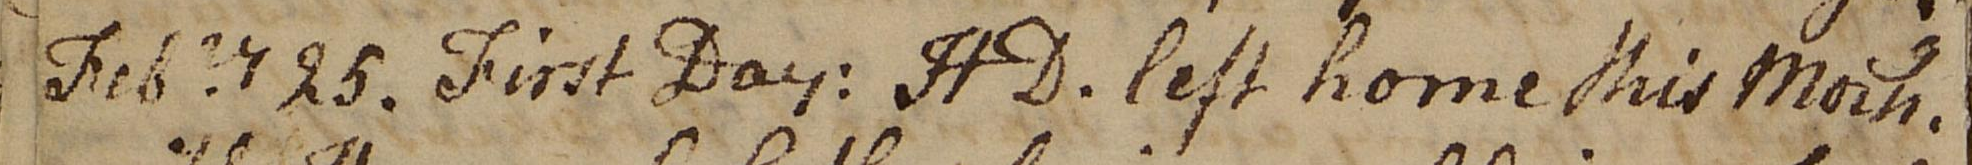Feb^ry. 25. First Day: HD. left home this Morn.^g
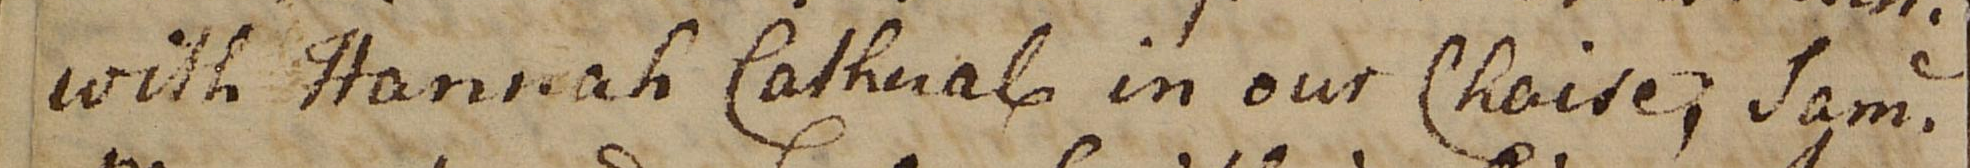with Hannah Catheral in our Chaise, Jam.^e
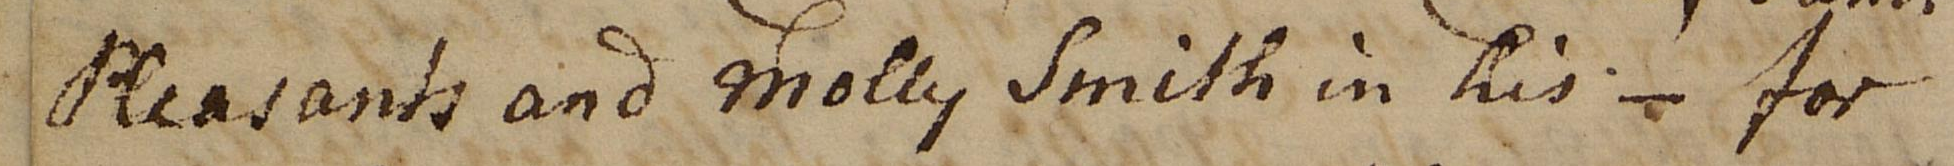Pleasants and Molly Smith in his- for
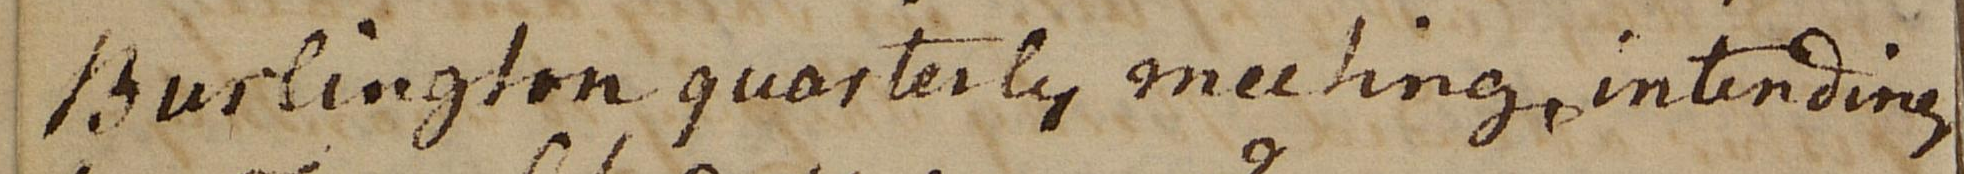Burlington quarterly meeting, intending
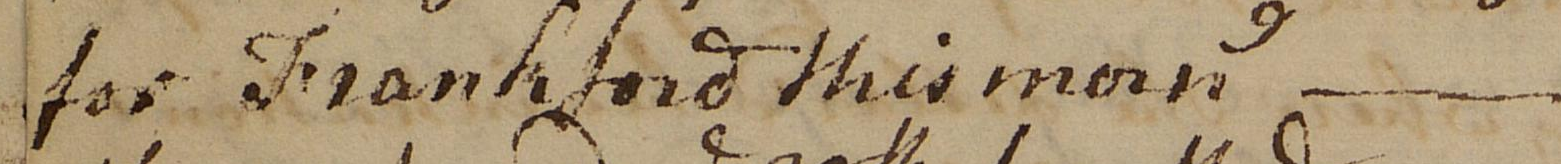for Frankford this morn^g-
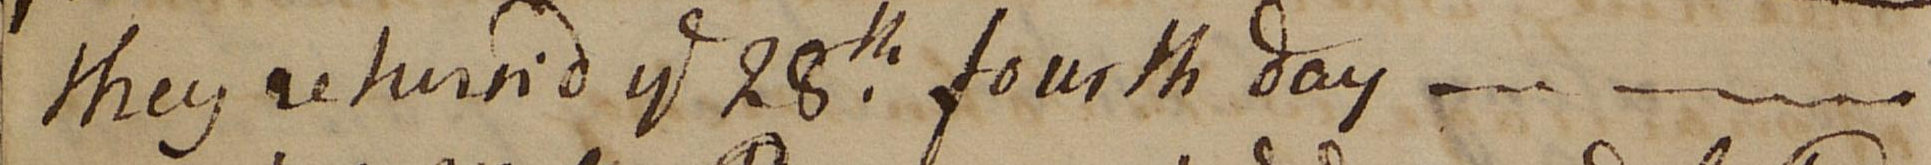they return'd y^e 28^th. fourth day--
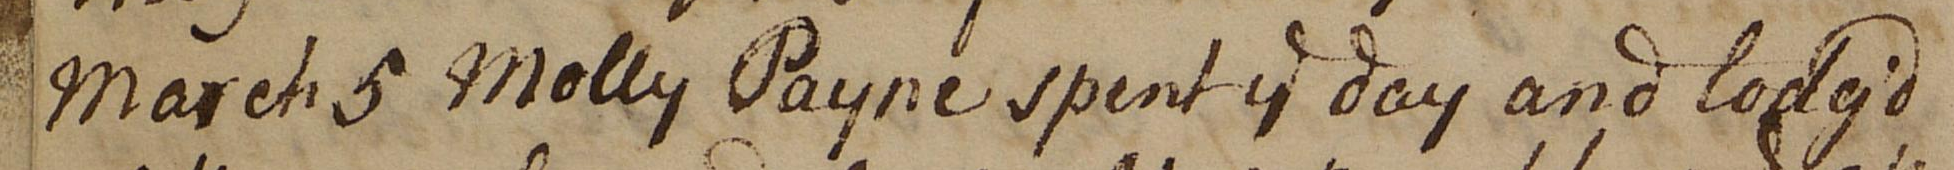March 5 Molly Payne spent y^e day and lodg'd
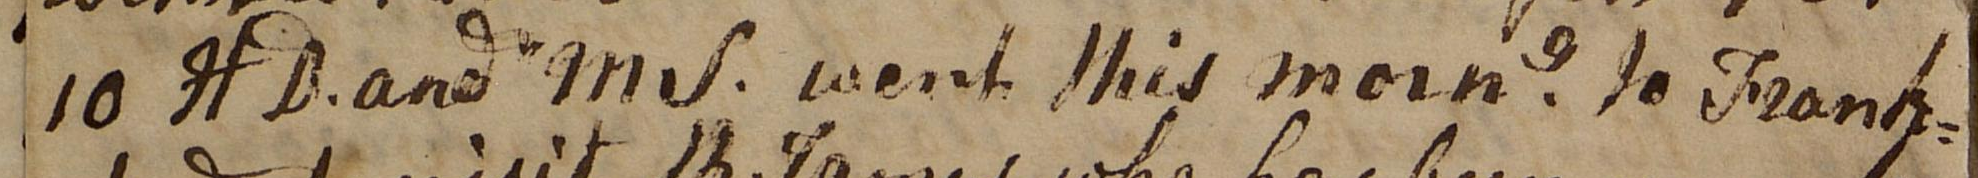10 HD. an MS. went this morn^g. to Frank-
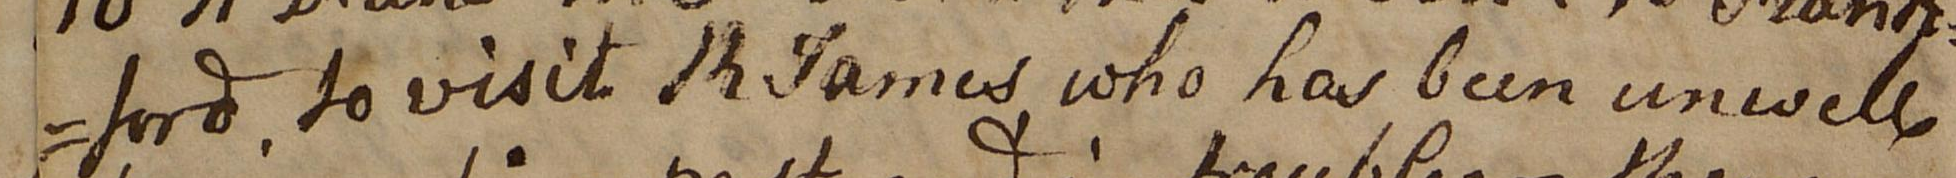-ford to visit R James, who has been unwell
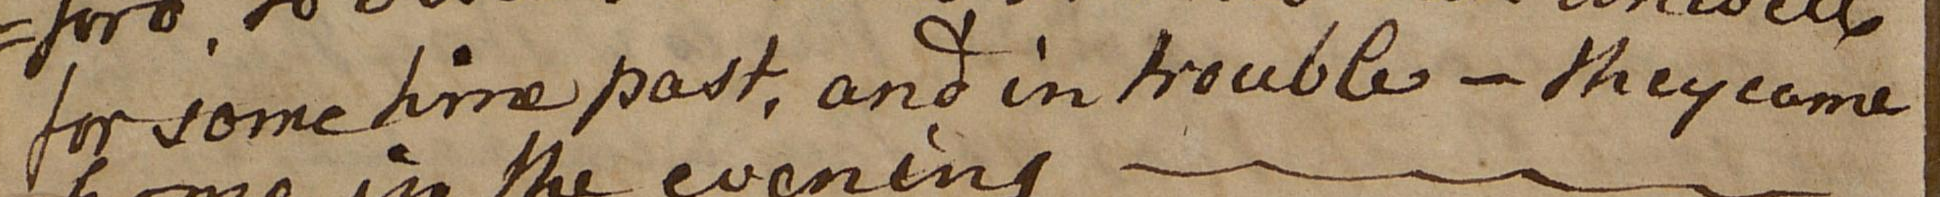for sometime past, and in trouble- they came
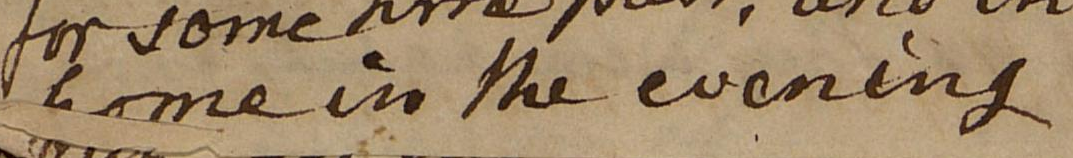home in the evening
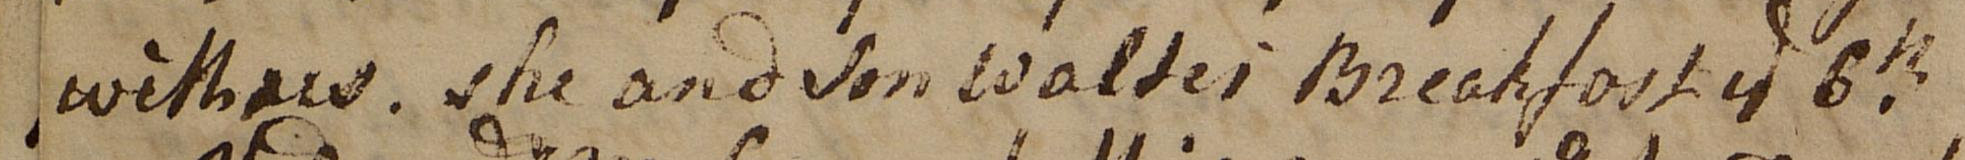with us, she and Son Walter Breakfast y^e 6^h.
